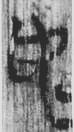四？
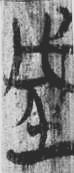城（成）
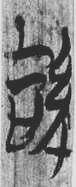結
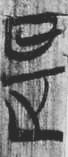是
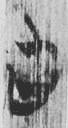古（故）
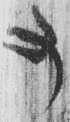又（有）
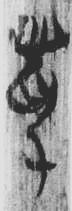○（一）
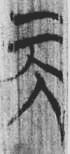天
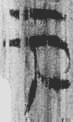下
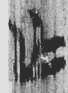亡（無）
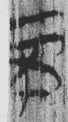不
